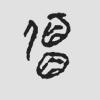{人角角}
